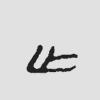亡
